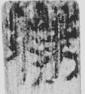○（帶）
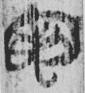龜
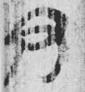尹
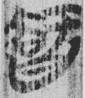智（知）
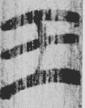王
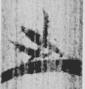之
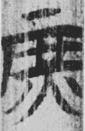庶（炙）
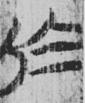於
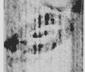日
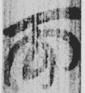而
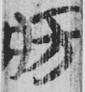○（病）
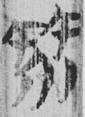○（疥）
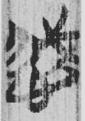○（儀）
